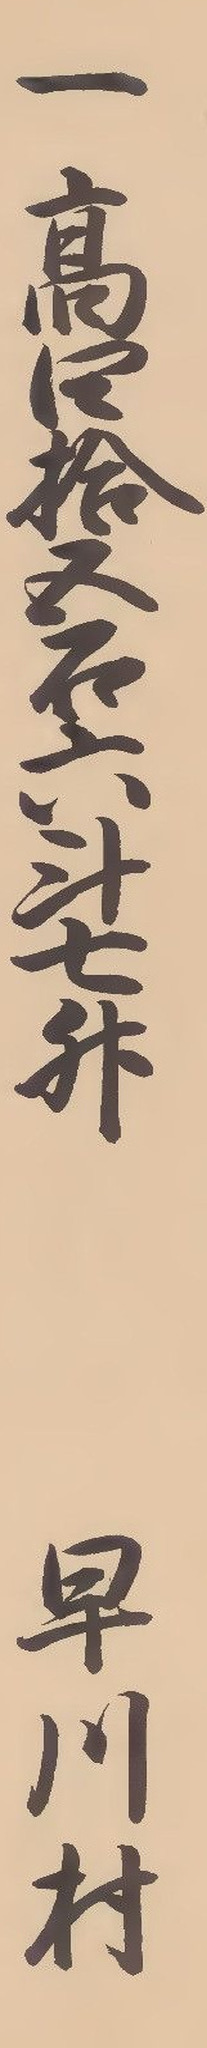一高四拾五石六斗七升早川村
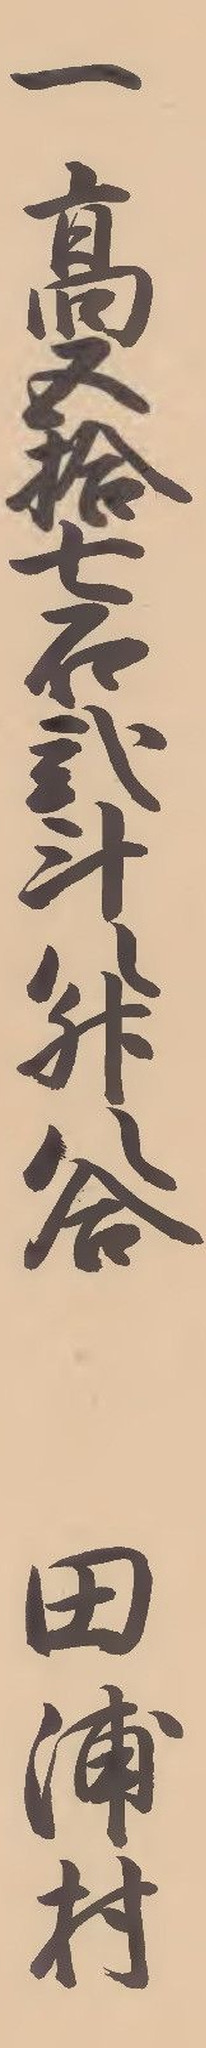一高五拾七石弐斗八升八合田浦村
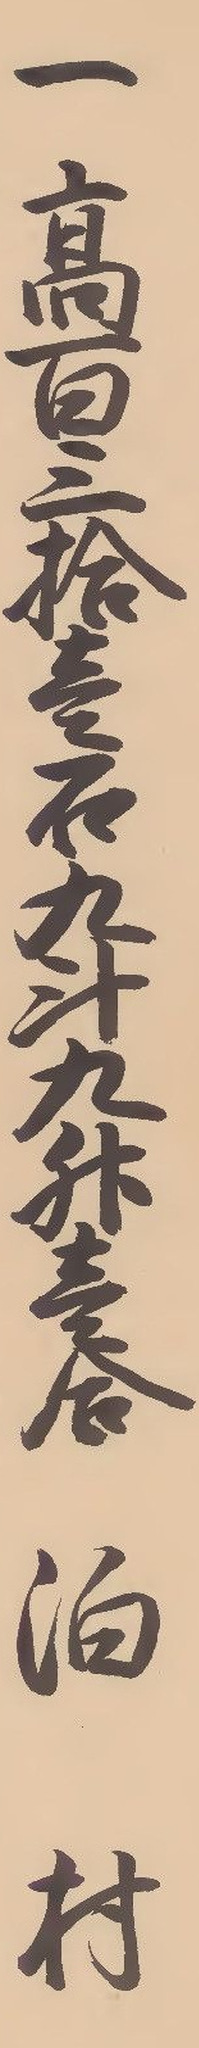一高百三拾壱石九斗九升壱合泊村

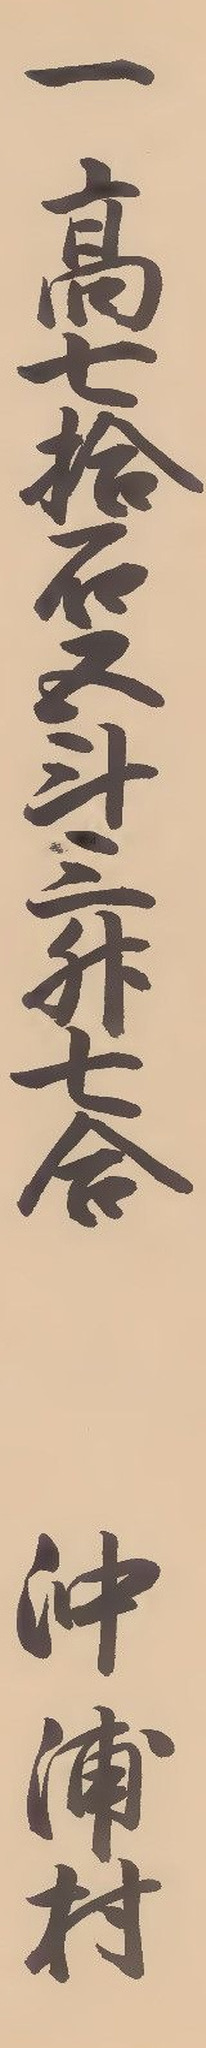一高七拾石五斗三升七合沖浦村
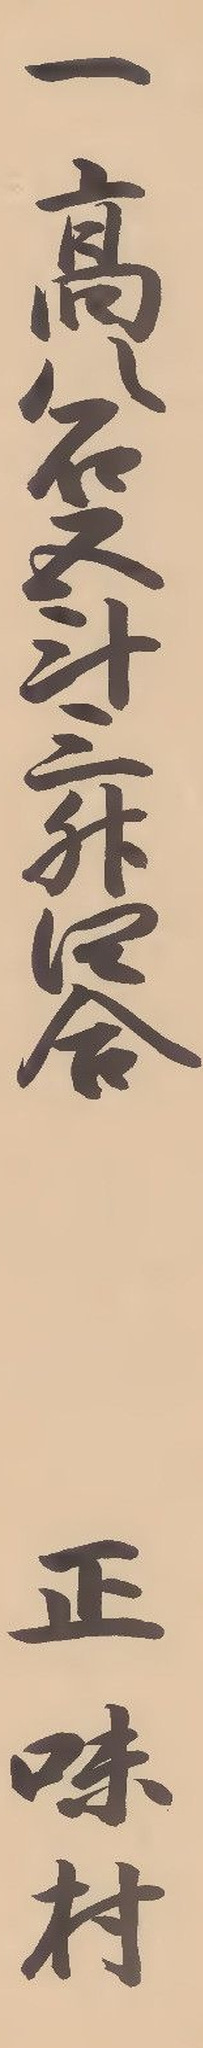一高八石五斗三升四合正味村
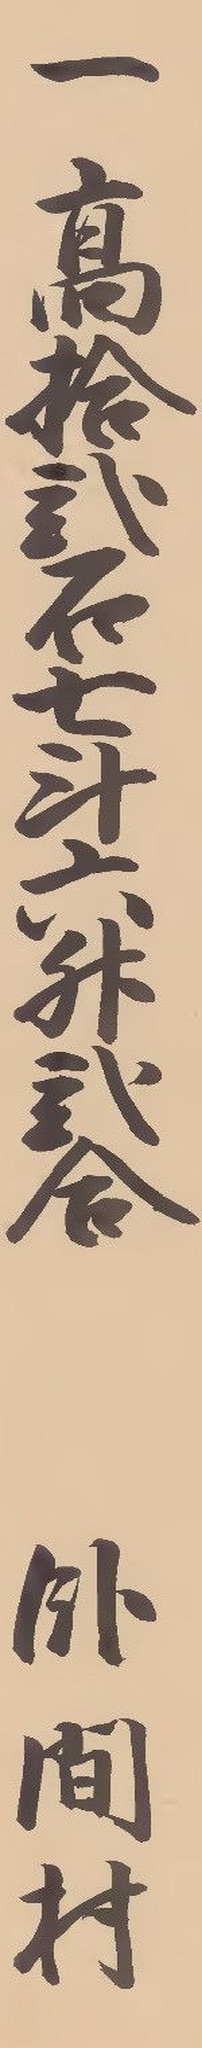一高拾弐石七斗六升弐合臥間村
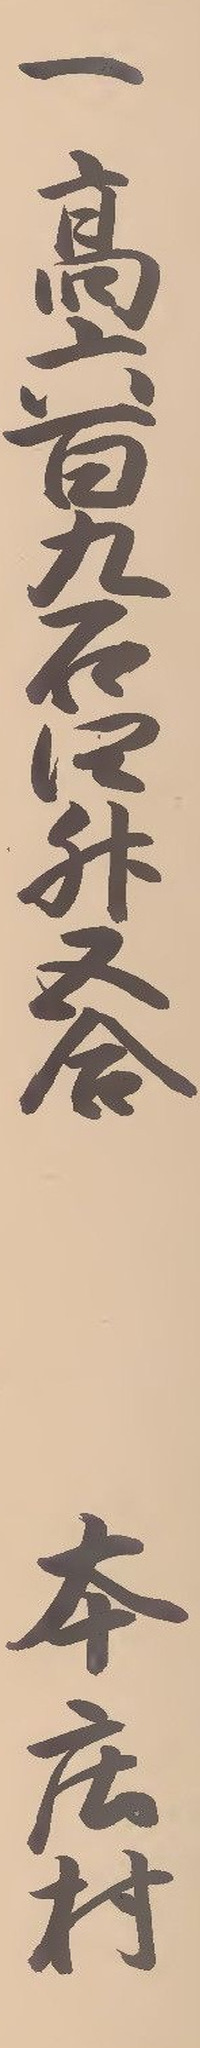一高六百九石四升五合本庄村
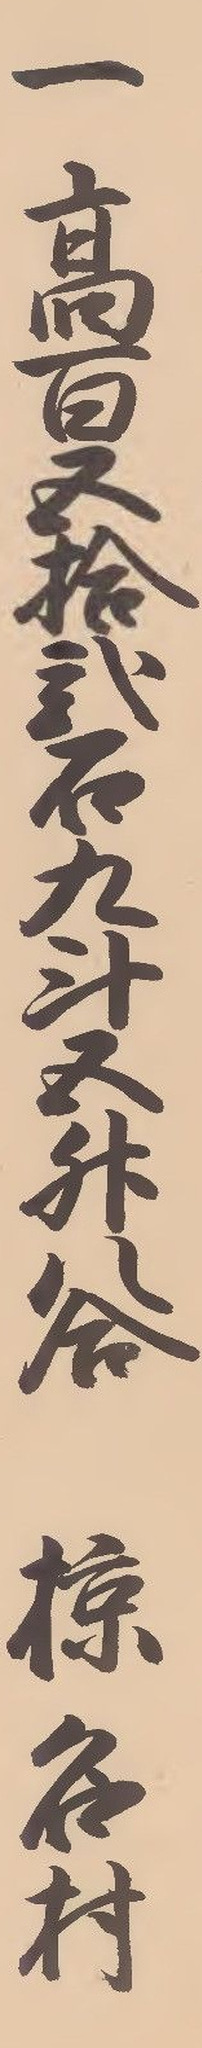一高百五拾弐石九斗五升八合椋名村
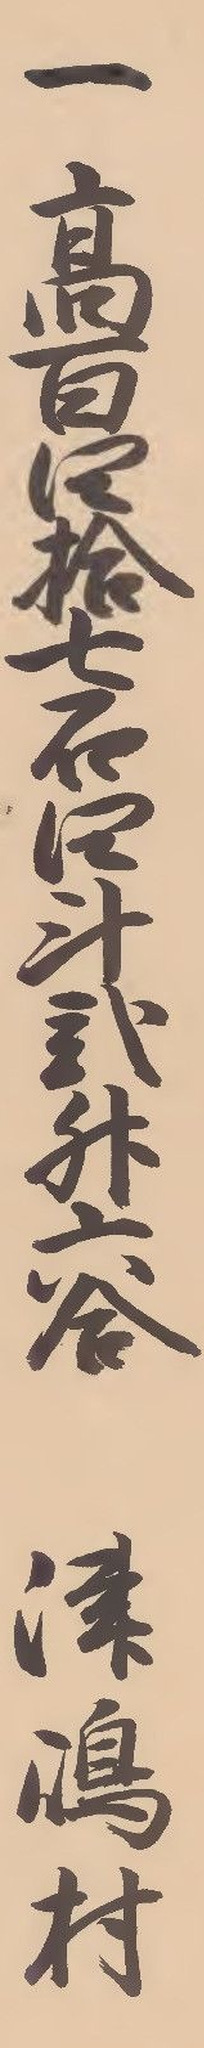一高百四拾七石四斗弐升六合津島村
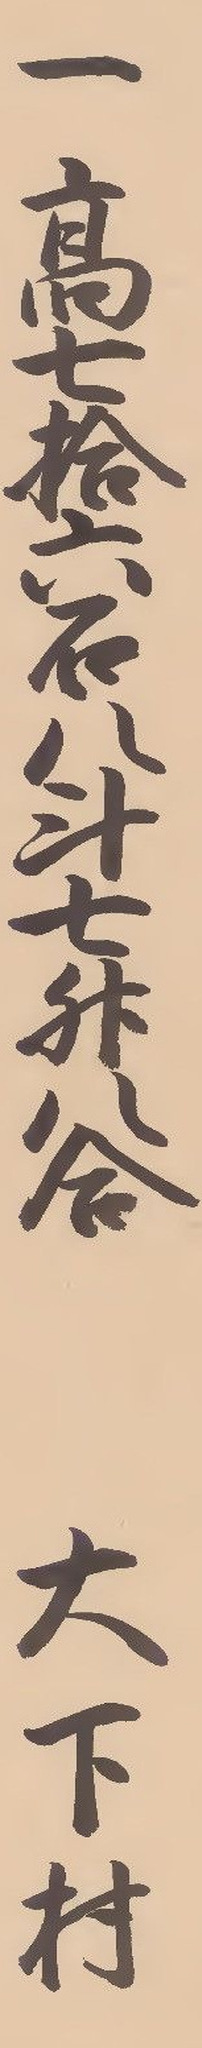一高七拾六石八斗七升八合大下村

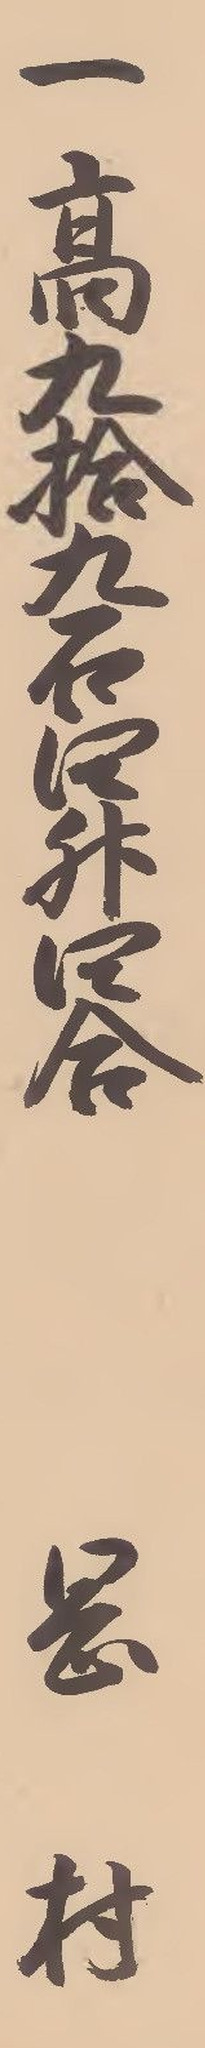一高九拾九石四升四合岡村
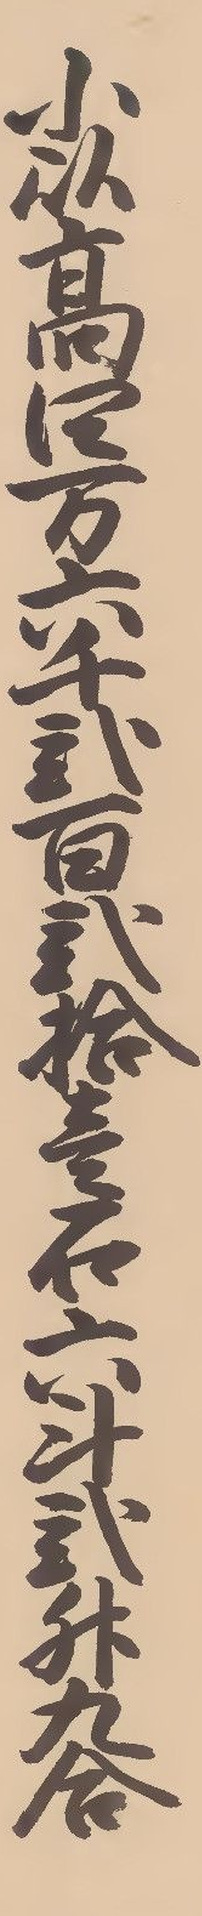小以高四万六千弐百弐拾壱石六斗弐升九合
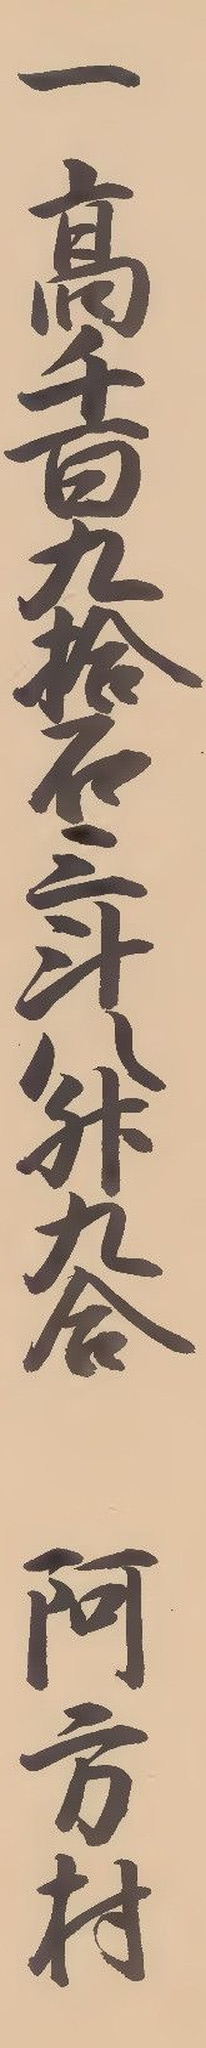一高千百九拾石三斗八升九合阿方村
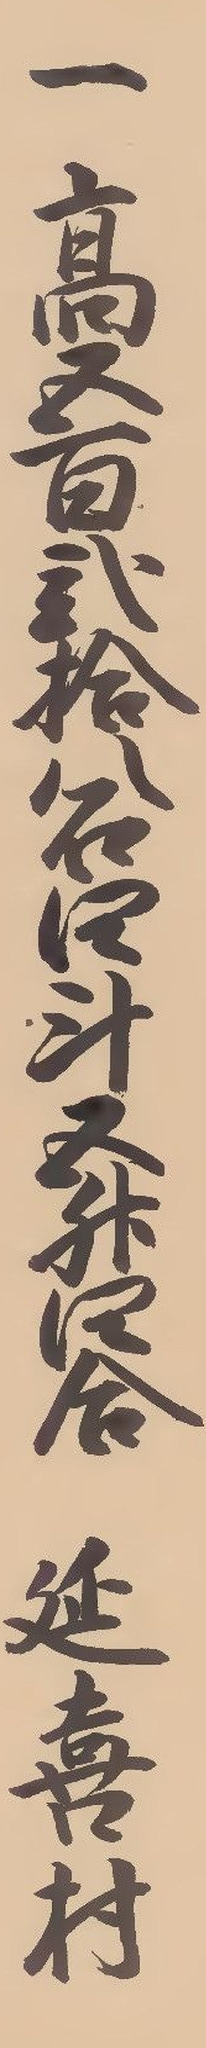一高五百弐拾八石四斗五升四合延喜村
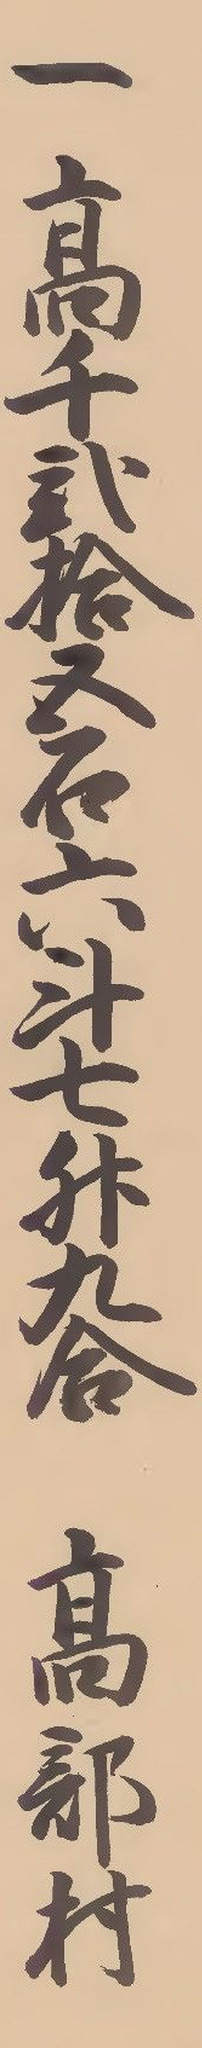一高千弐拾五石六斗七升九合高部村

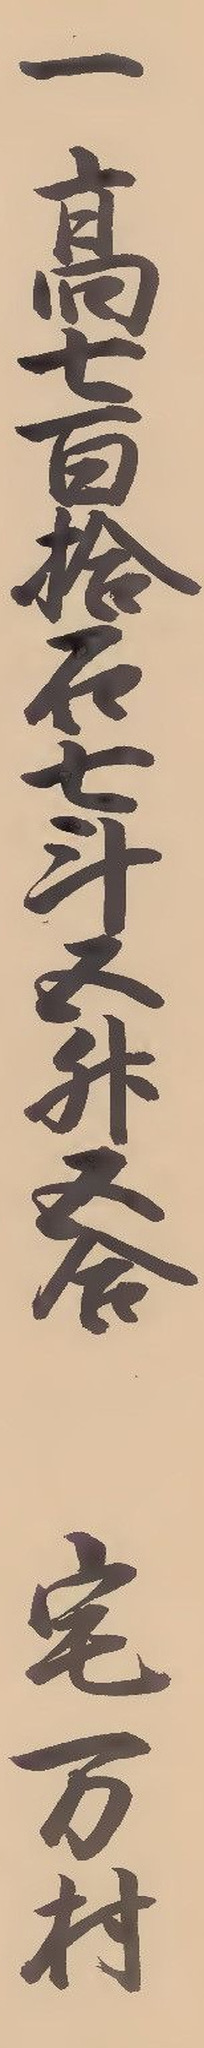一高七百拾石七斗五升五合宅万村
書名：伊予国郷帳
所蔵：国立公文書館 National Archives of Japan
